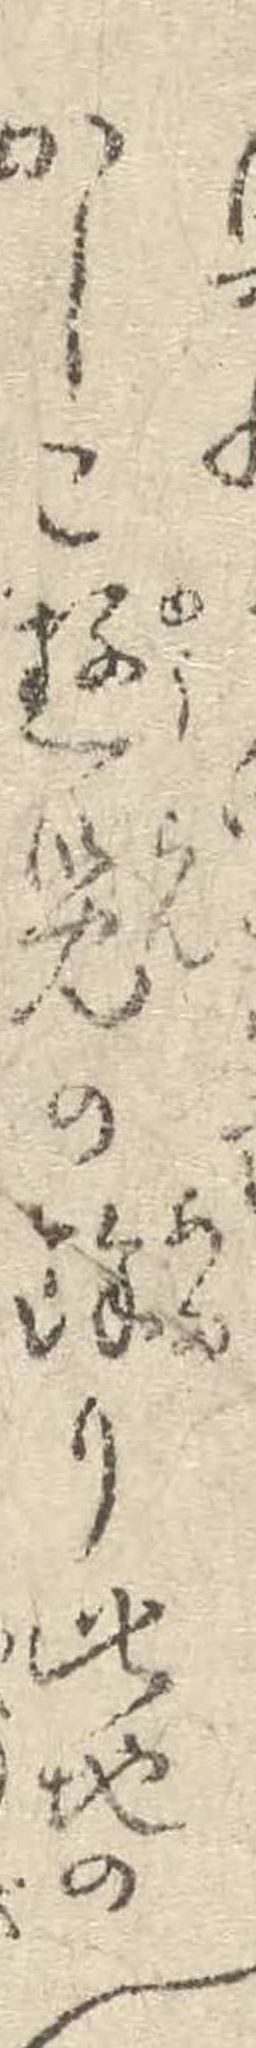かしこ遊覧の余り此地の
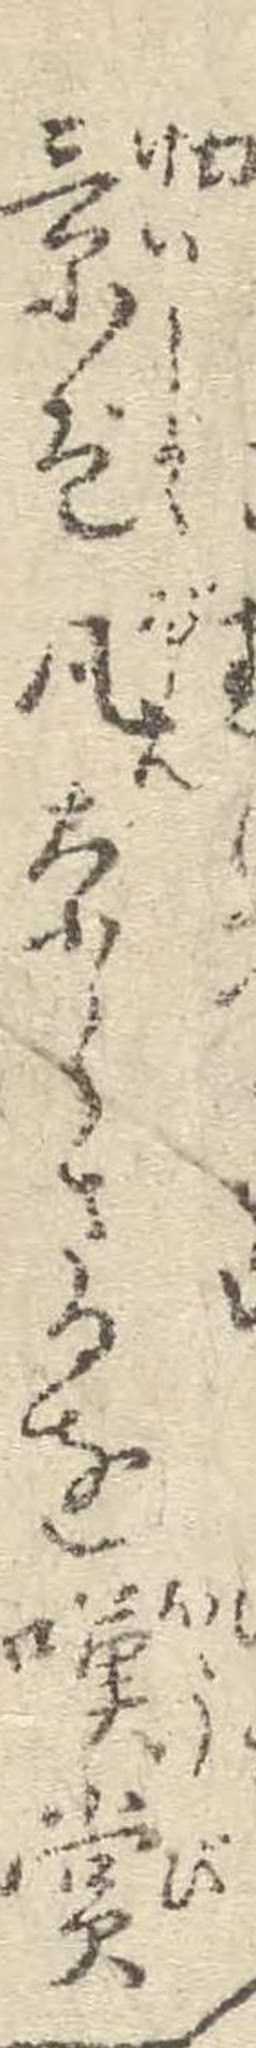景色凡ならさるを嘆賞
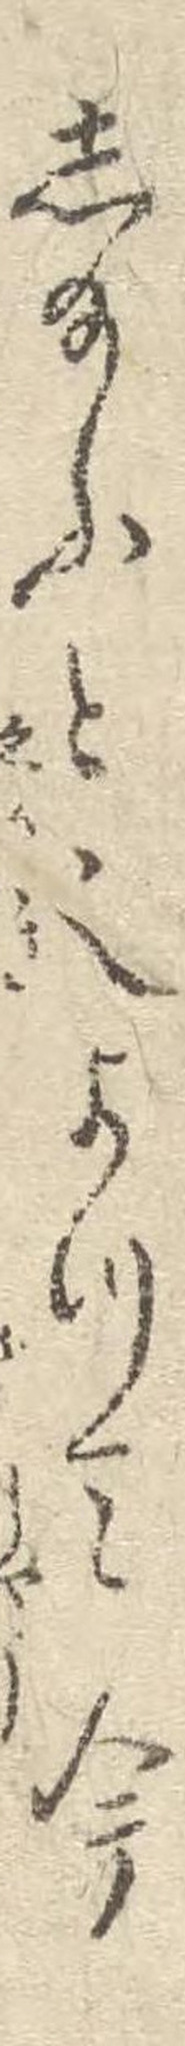し給ふと也よつて今
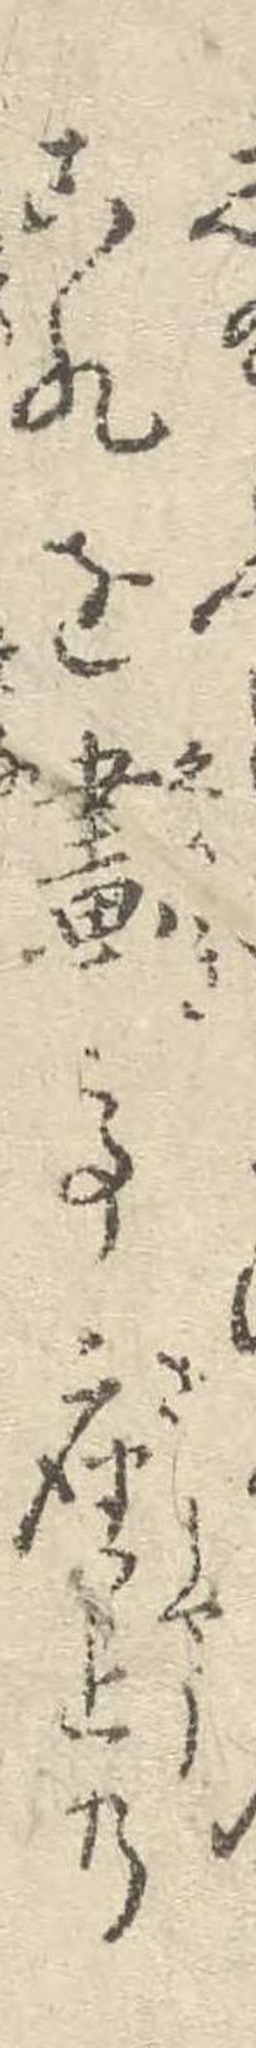これを画て座上の
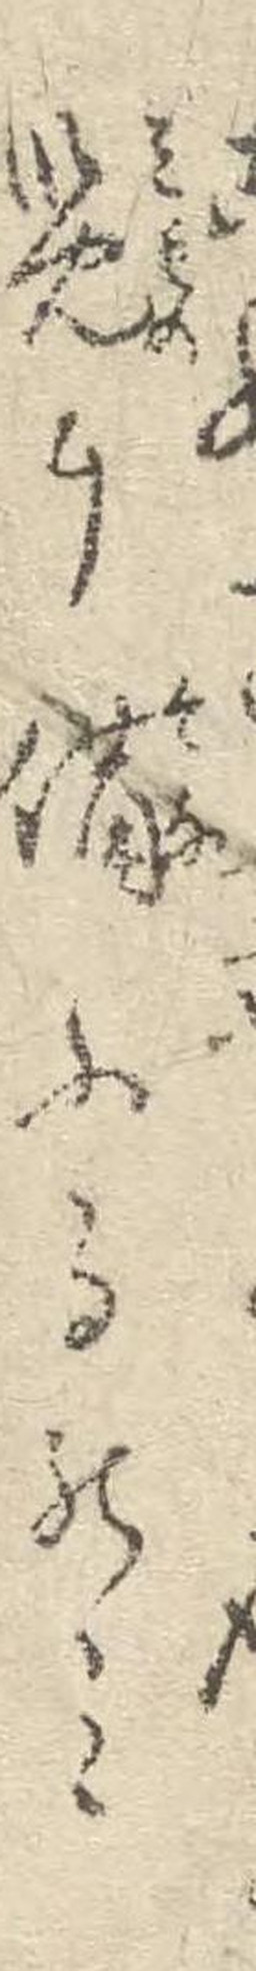覧に備ふるのみ
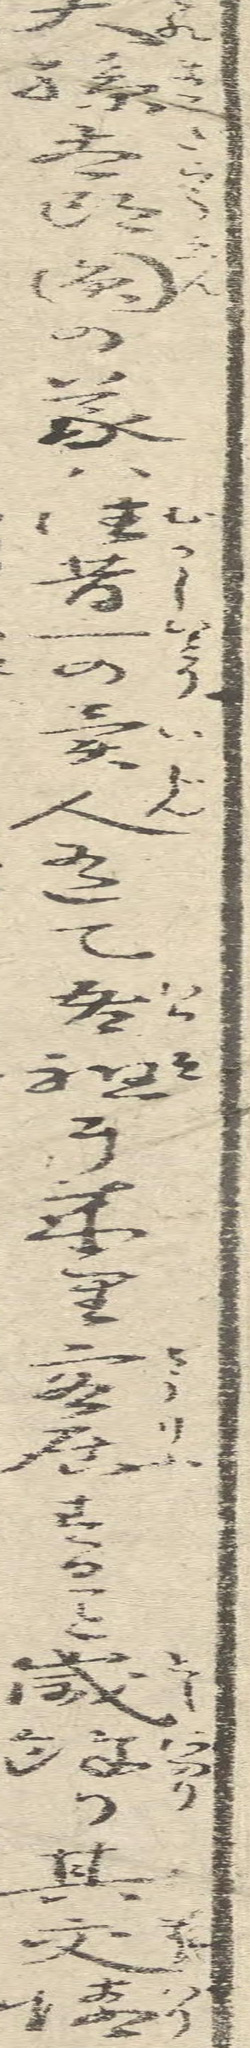夫孫太郎円の義は往昔一の異人有て吾祖に来り客居すること歳余か其交情
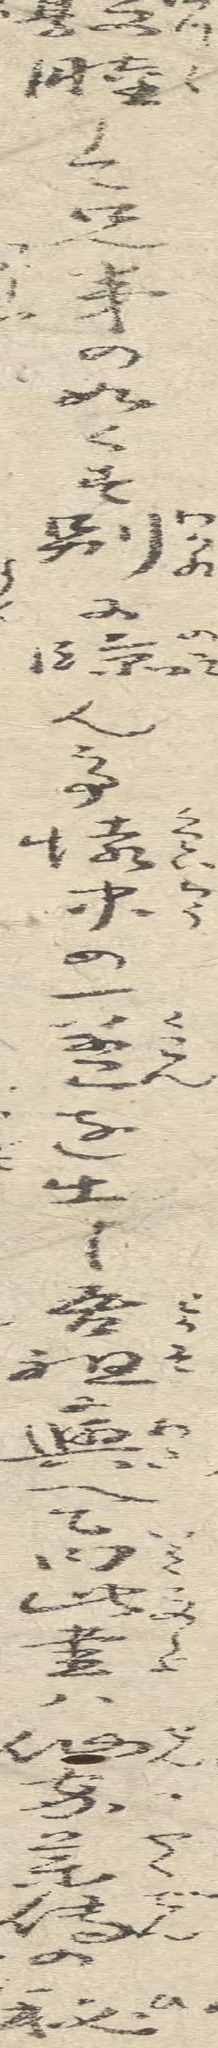敦睦して兄弟の如くす別に臨んて懐中の一巻を出し吾祖に与へて曰此書は仙家薬伝の秘
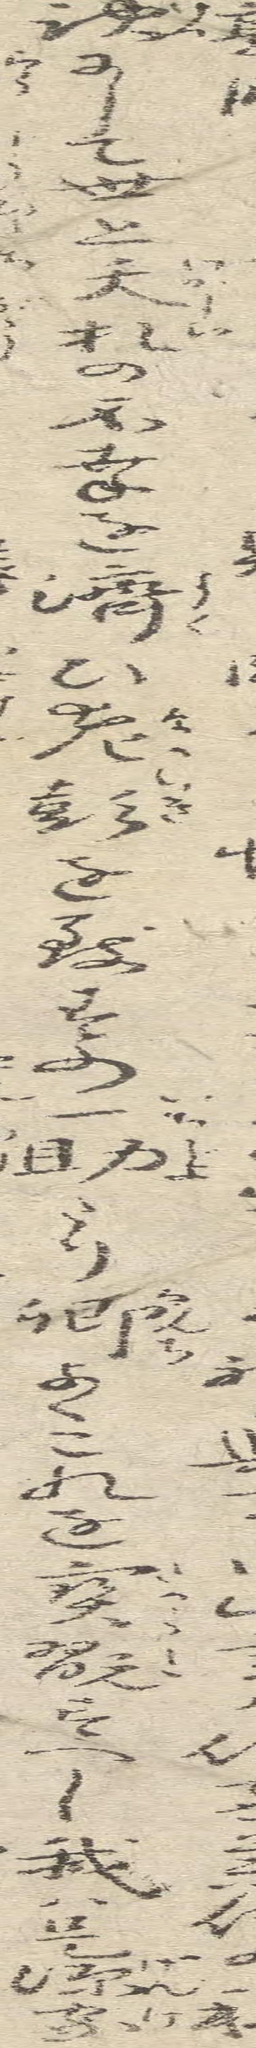決にして世と夭札の不幸を済ひ老彭を致すの一助たり卿よくこれを宝翫すへし我は是源家
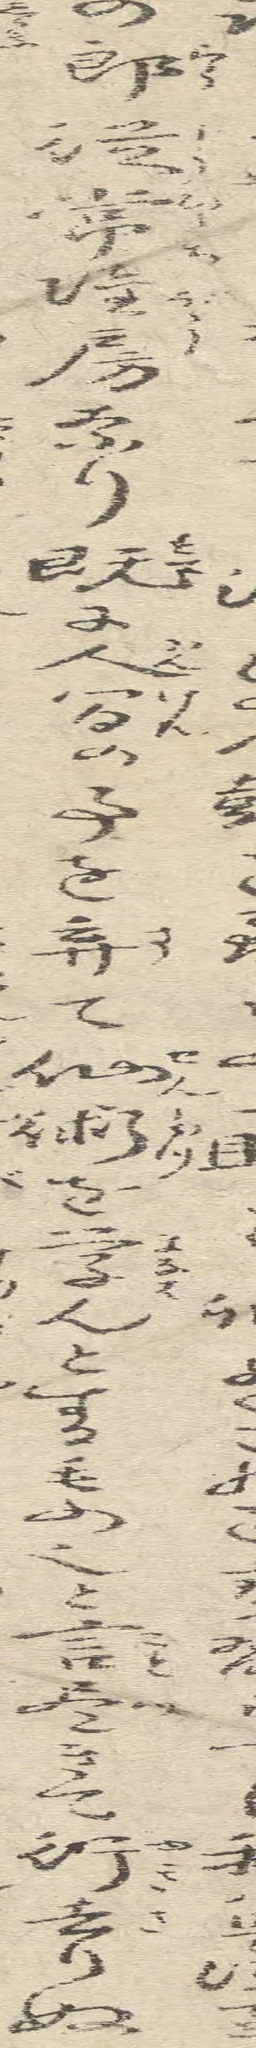の郎従常陸房なり既に人間の事を棄て仙術を学んとするもの也と言尽きて行去りぬ
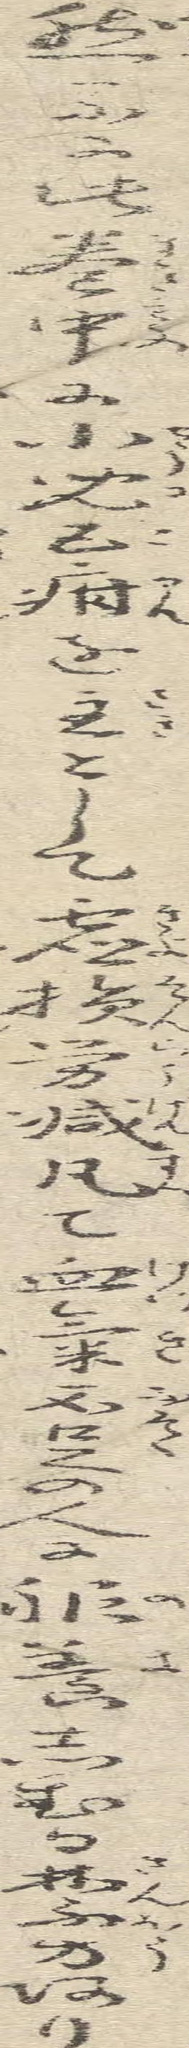然なに此巻中に小児五疳を主として虚損労減凡て血気不足の人に服養しむる禁方あり
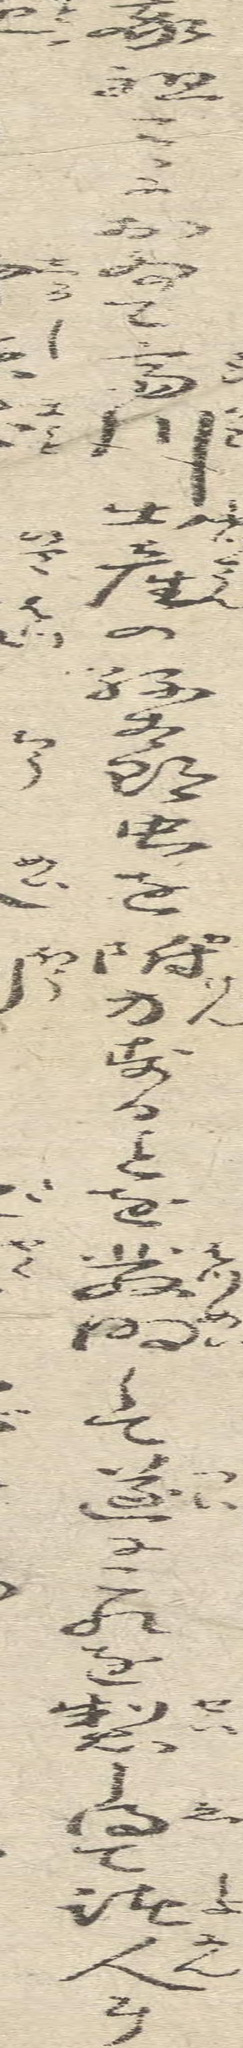家祖こゝにおゐて斎川出産の孫太郎虫を附方することを発明して遂にこれを製し得て諸人に
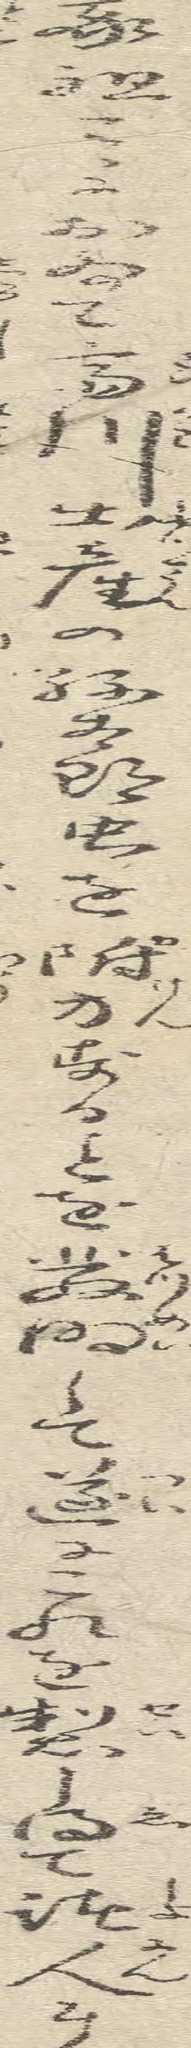家祖こゝにおゐて斎川出産の孫太郎虫を附方することを発明して遂にこれを製し得て諸人に
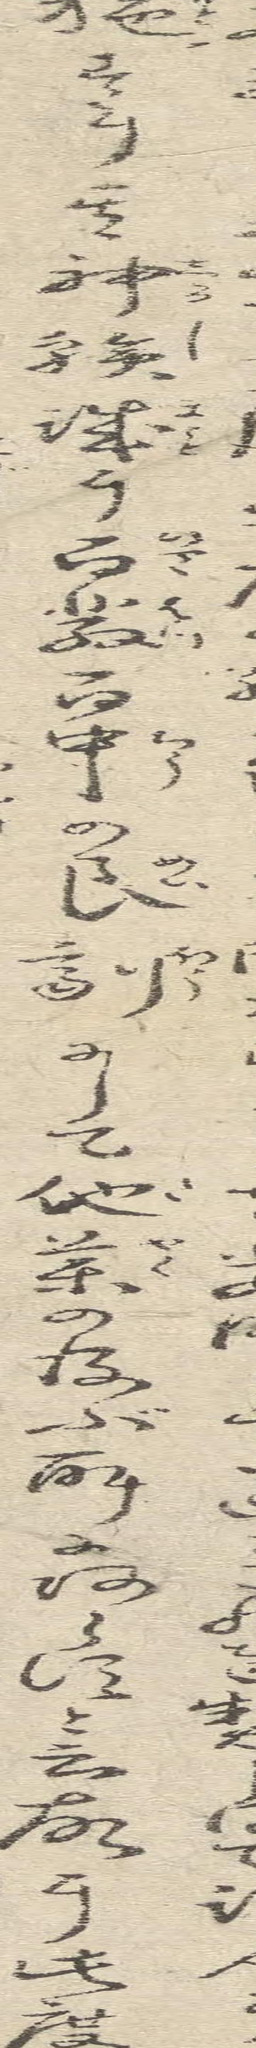施すに其神験誠に百発百中の良剤にして他薬の及ぶ所にあらすと云故に此度
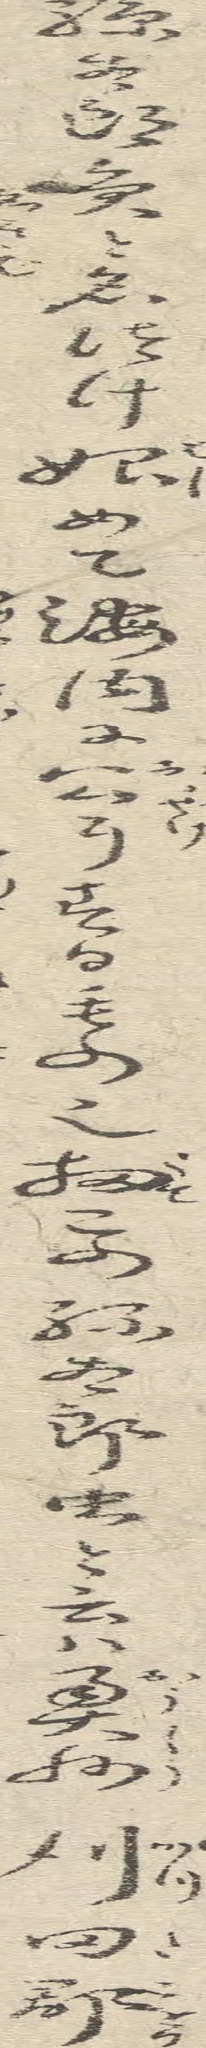孫太郎円と名つけ始めて海内に公にするもの也扨この孫太郎虫と云は奥州刈田郡
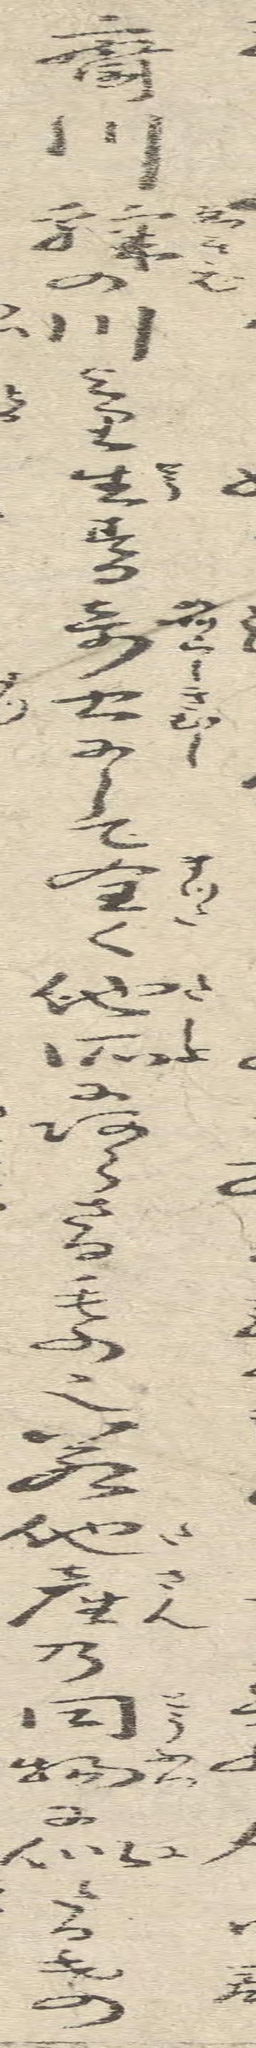斎川駅の川より生する奇虫にして全く他所にあらさるもの也若他産の同物に似たるもの
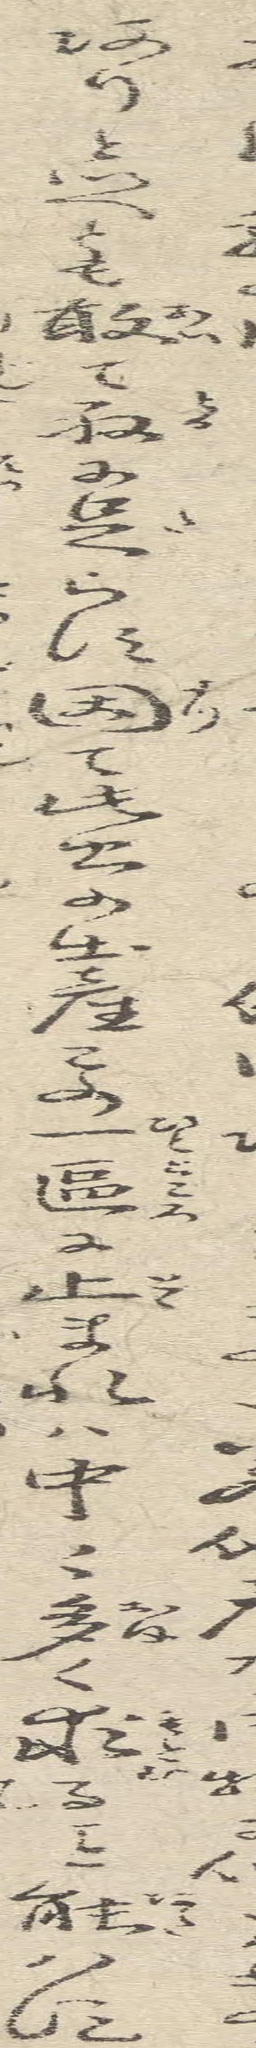ありといへとも敢て取に足らす因て此虫の出産この一区に止まれは中々多く求ること能はす
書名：浪華薬種問屋能書張交帖. 一
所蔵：国立国会図書館 National Diet Library, JAPAN
